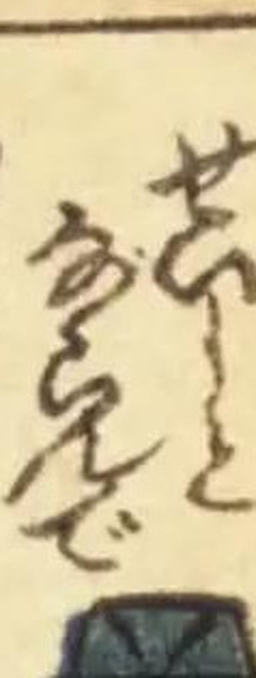ならんで
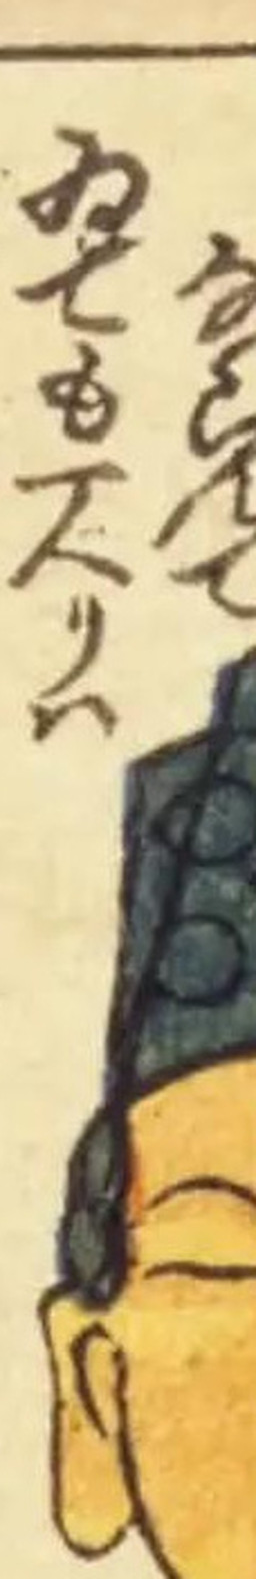ゐても一人りは
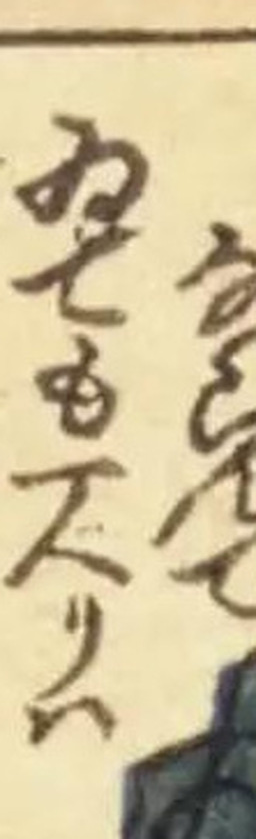ゐても一人りは
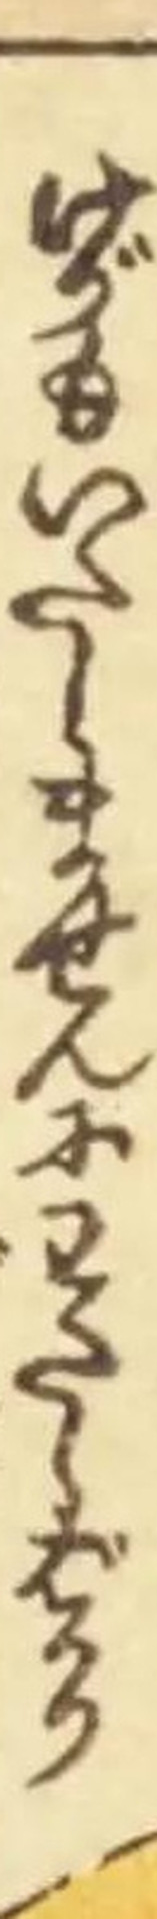けがもいたしませんにわたしばかり
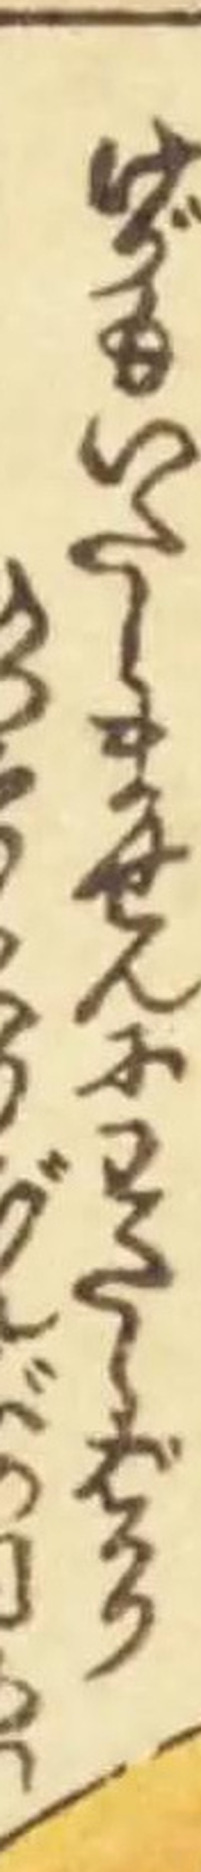けがもいたしませんにわたしばかり
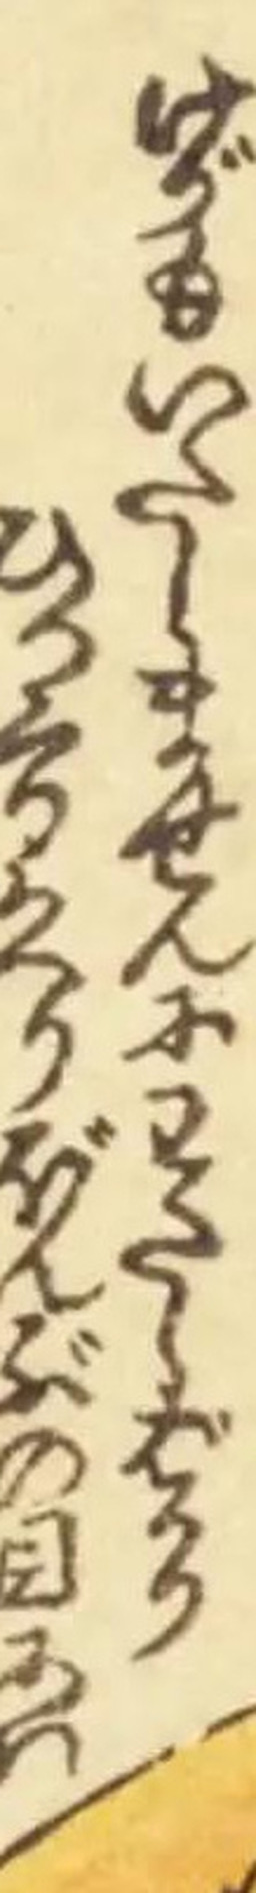ひかくるかへりぼんぶの目には
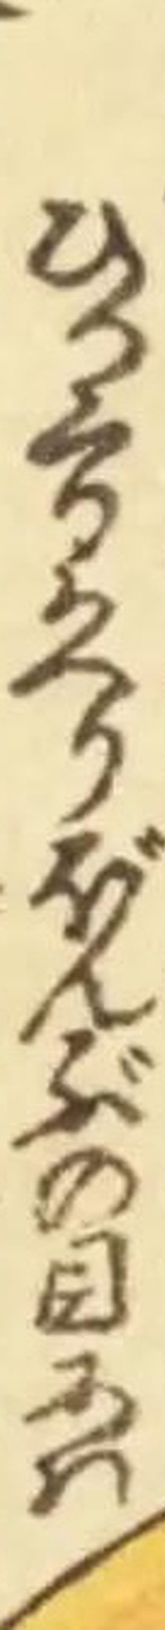ひかくるかへりぼんぶの目には
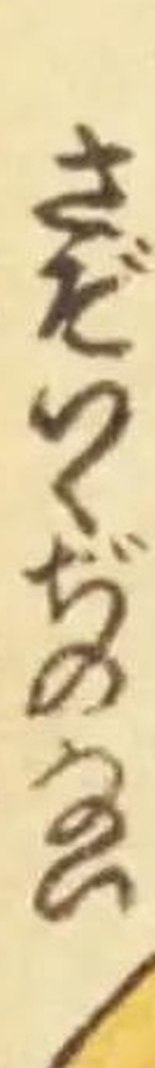さぞいくぢのない
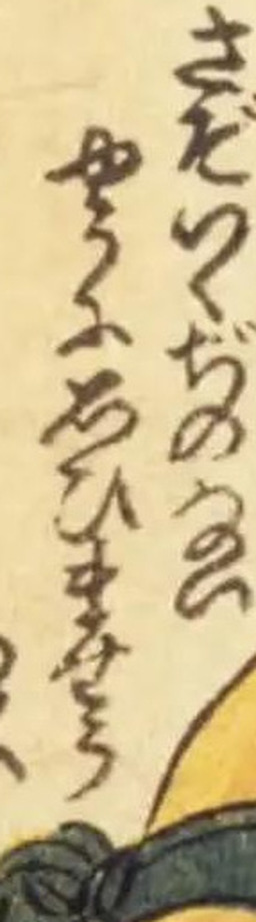やうに思ひませう
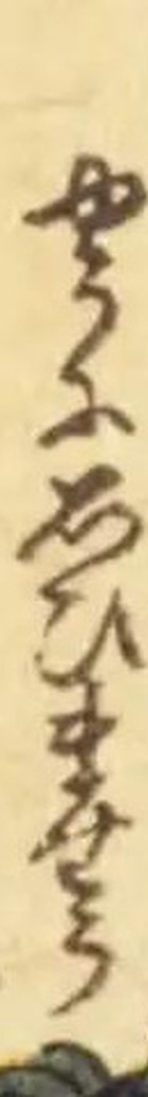やうに思ひませう
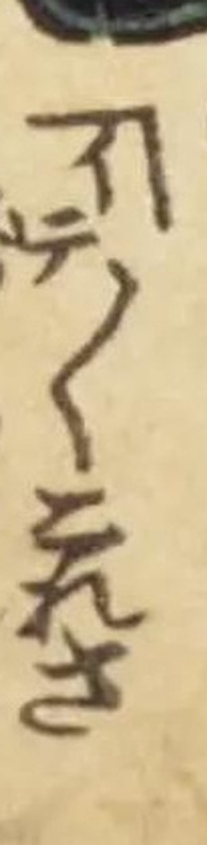「イテ〳〵これさ
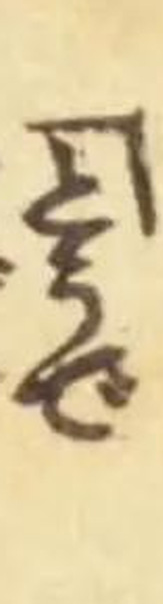「とうで
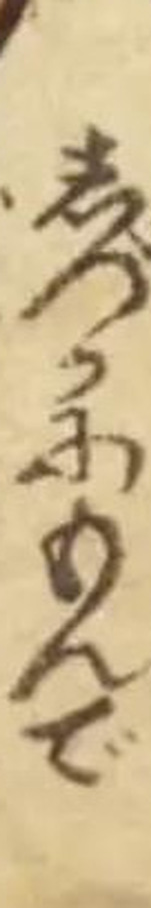しづかにもんで
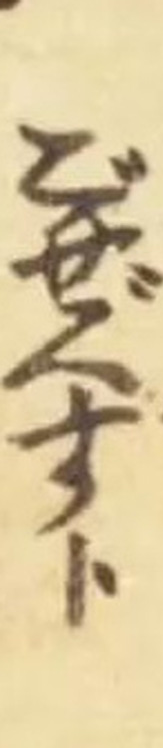ごぜへすと
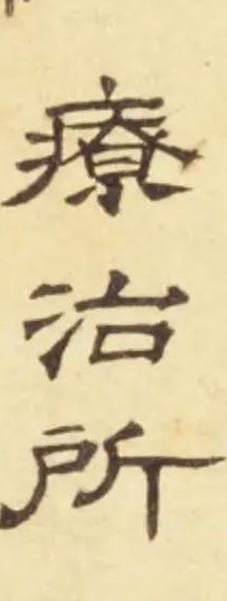療治所
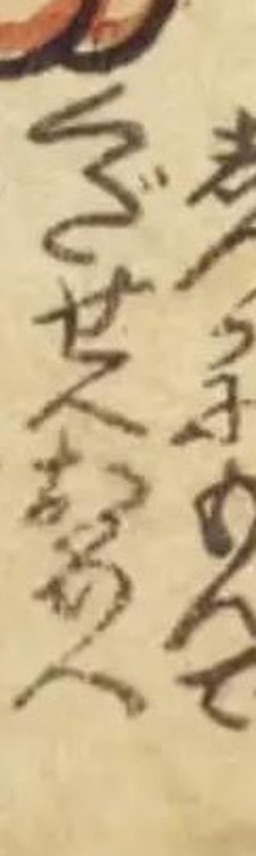くだせへおめへ
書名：安政二年十月二日地震出火後日角力
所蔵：国立国会図書館 National Diet Library, JAPAN
